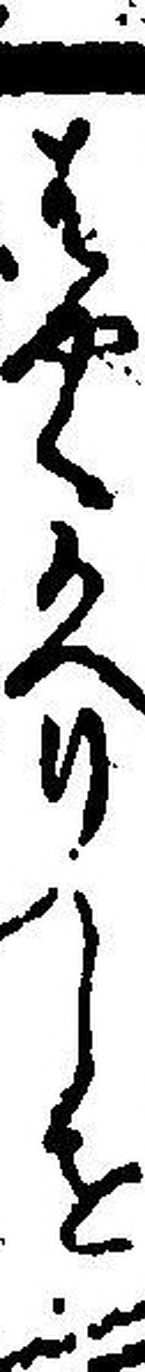はやくかへりしを
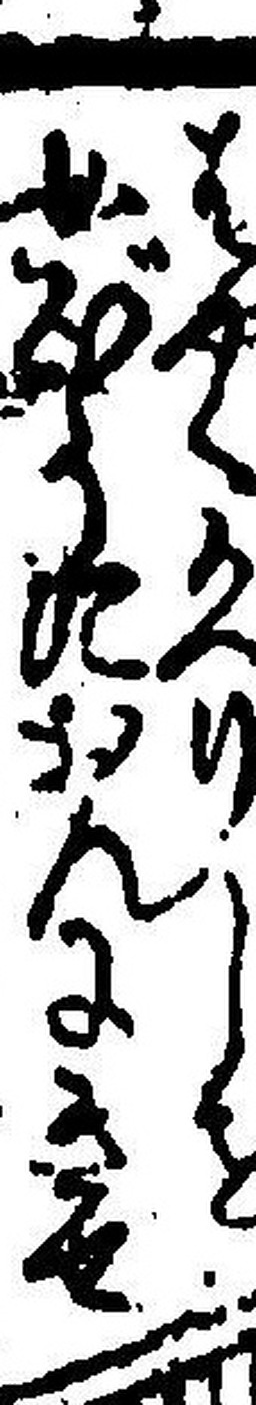女ぼうにおんにきせ
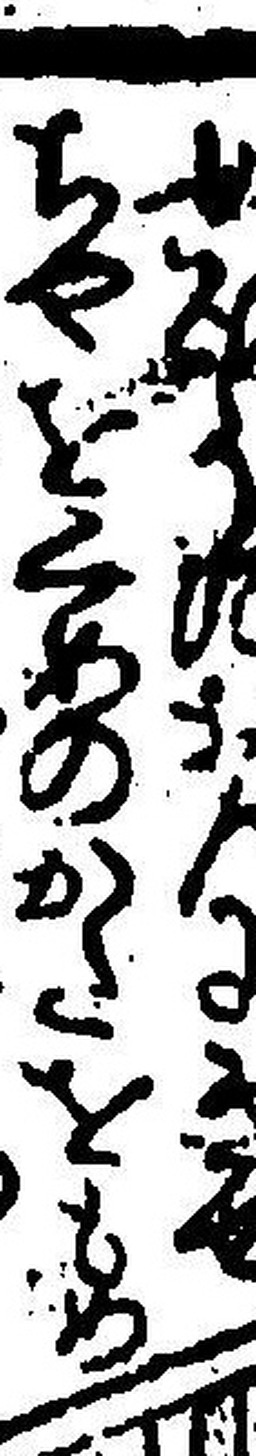ちやをくめのかたをもめ
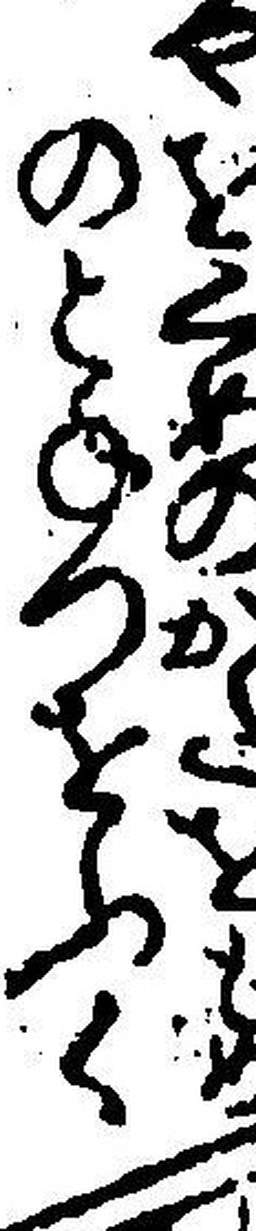のとねつをふく
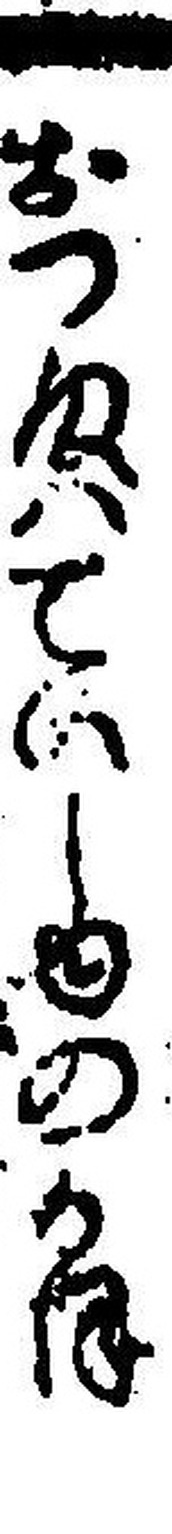おつまはていしゆのかほ
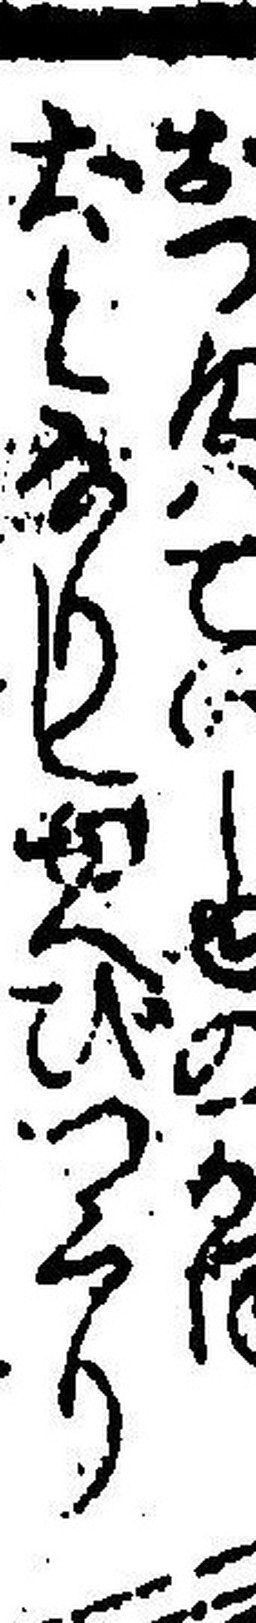犬となりしゆへびつくり
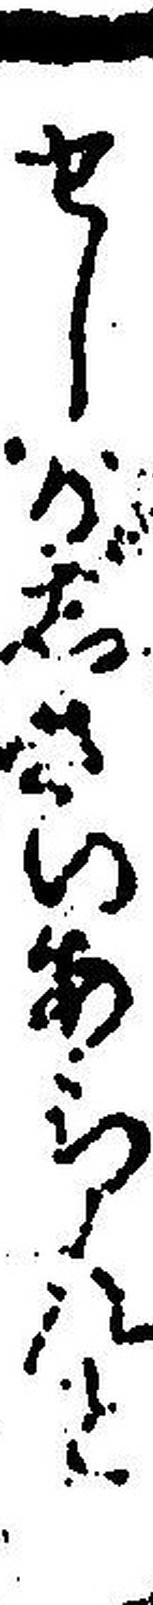せしかしさいあらんと
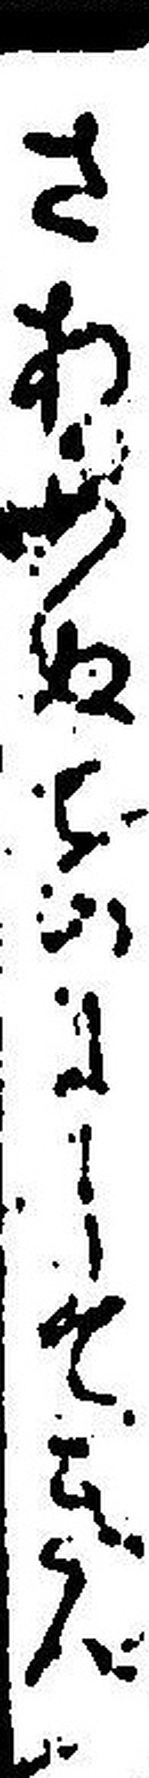さあらぬていにしてきん
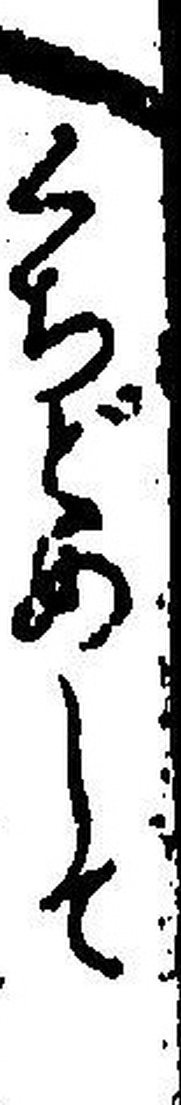くちどめして
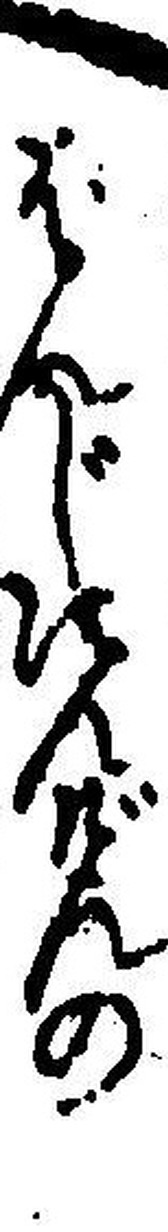ばんじにんげんの
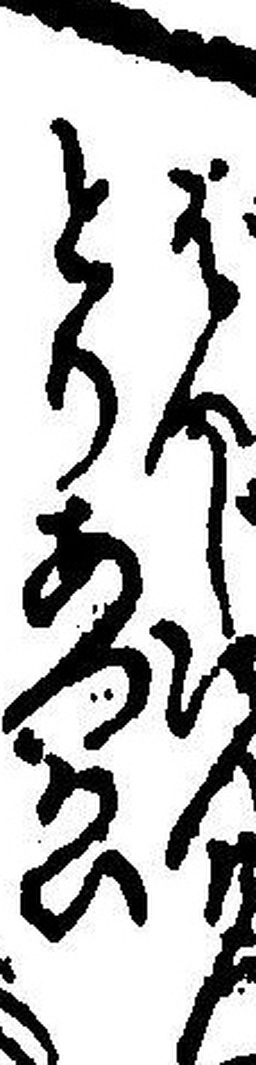とりあつかい
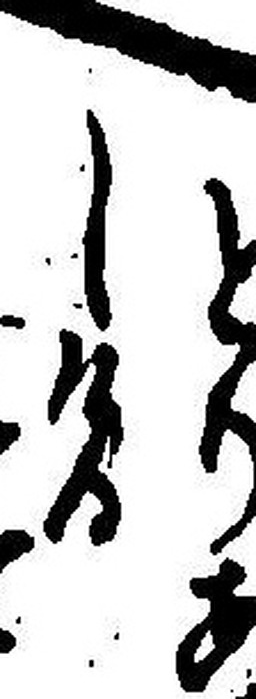しける
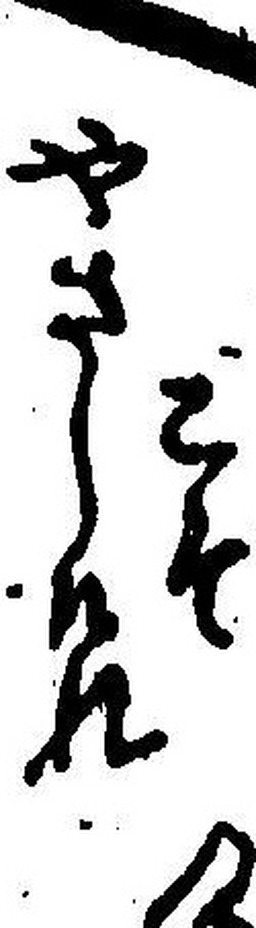やさしけれ

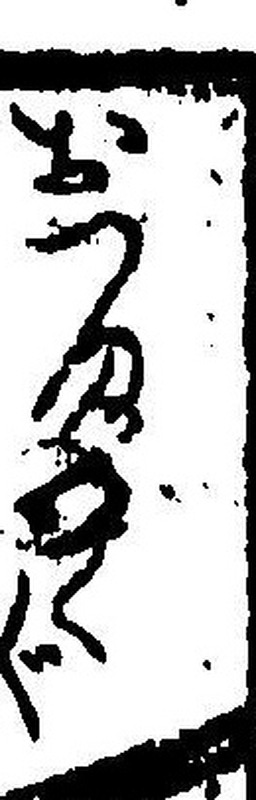おつまつく
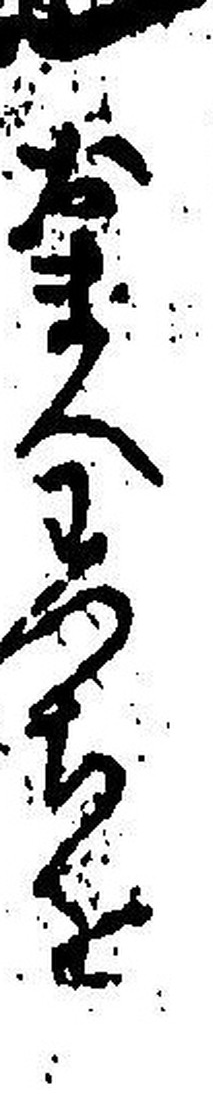おまへわつちを
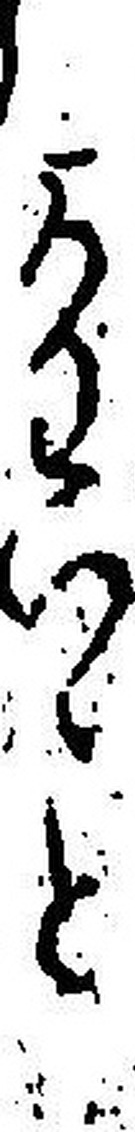かわいゝと
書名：花芳野犬斑 / 山東京伝作
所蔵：東京大学総合図書館 General Library in the University of Tokyo, JAPAN
